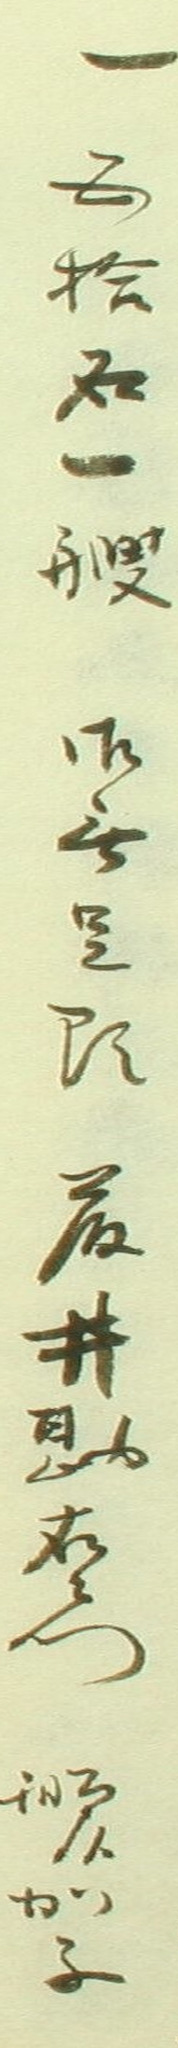一五拾石一艘御？足頭藤井勘右衛門船頭加子
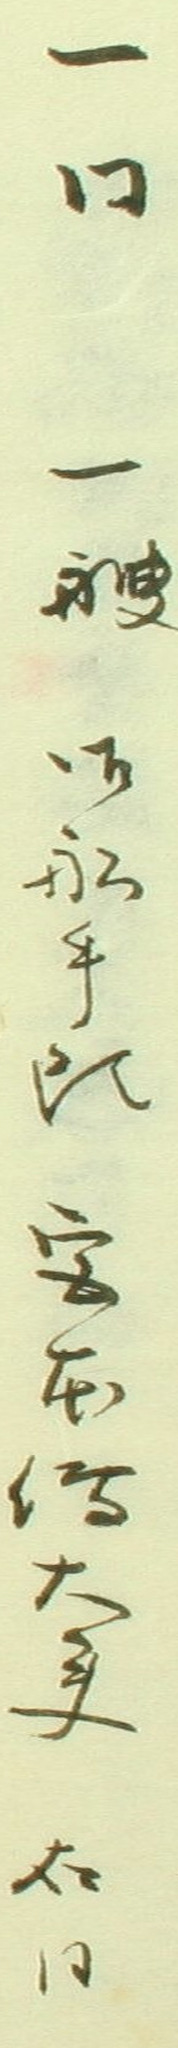一同一艘御船手頭宮本伝太夫右同
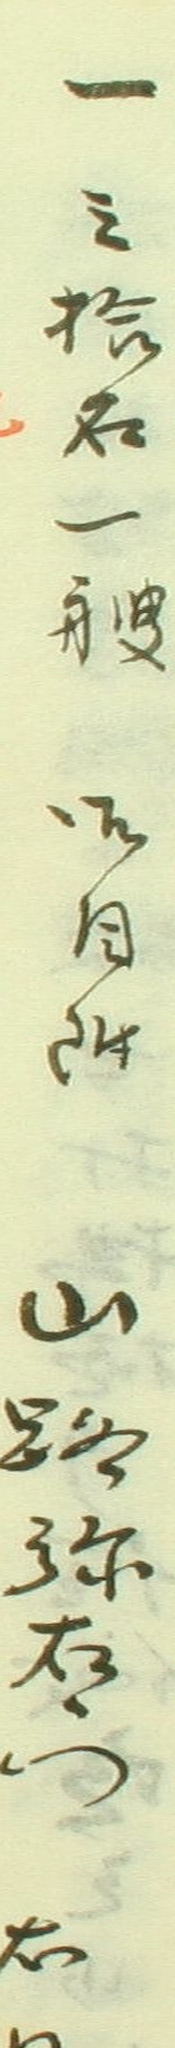一三拾石一艘御目附山路弥右衛門右同
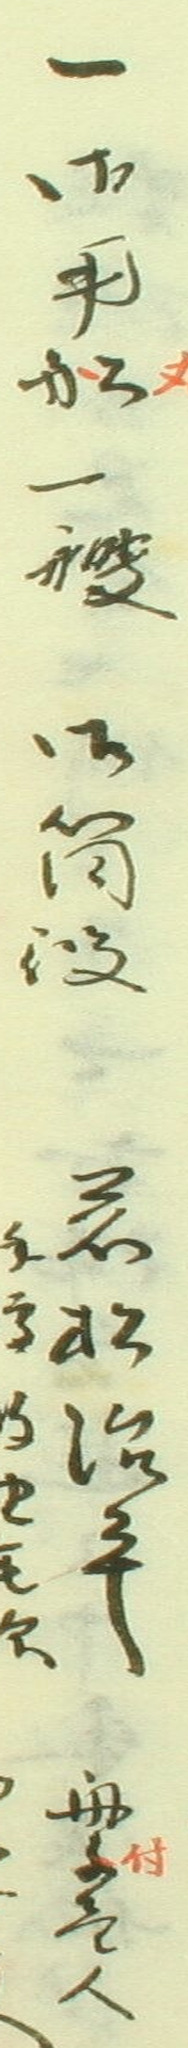一御用船一艘御筒役若松治平船子壱人
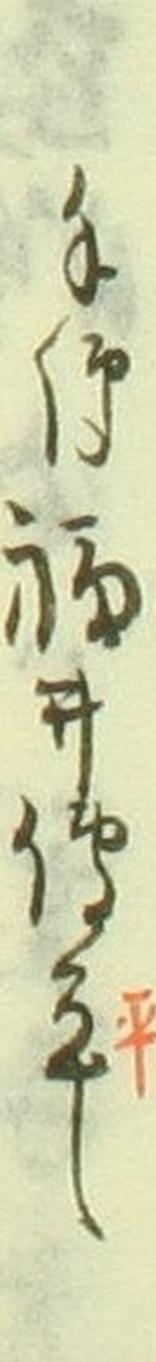手伝福井伝平
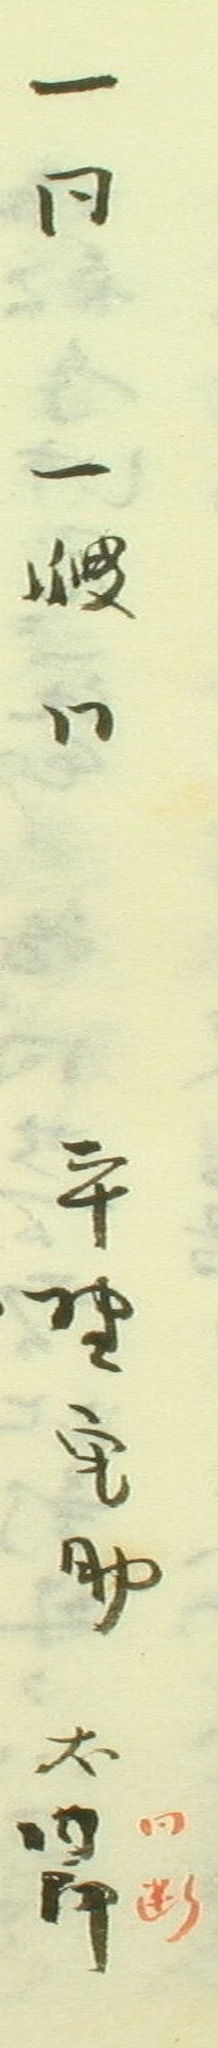一同一艘同平野宅助右同断
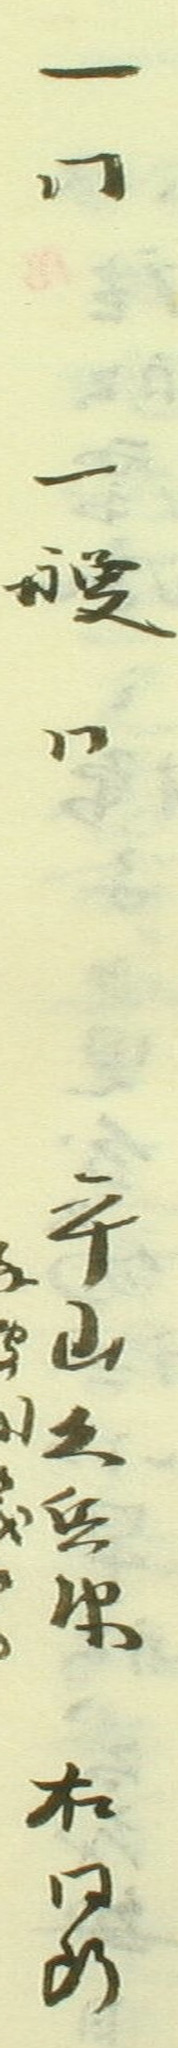一同一艘同平山久兵衛右同断
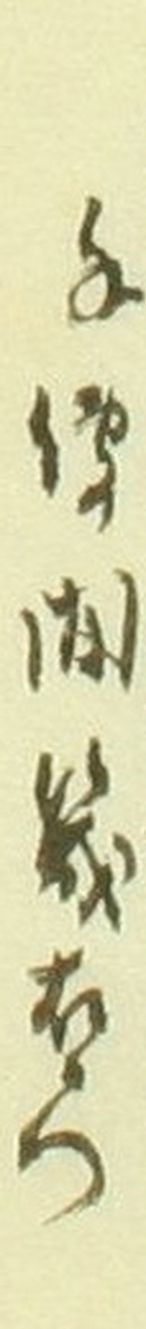手伝間幾右衛門
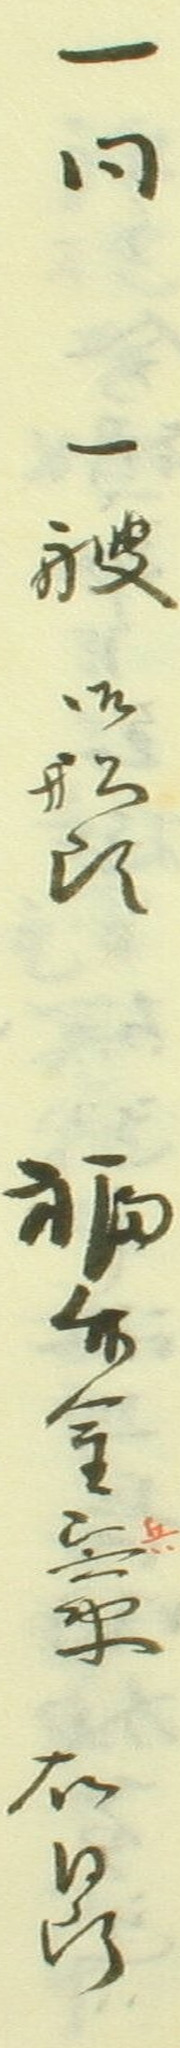一同一艘御船頭福井金兵衛右同断
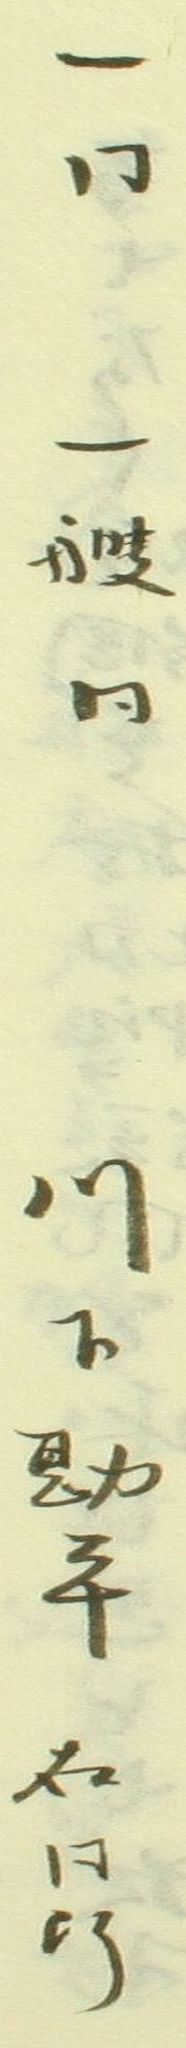一同一艘同川下勘平右同断
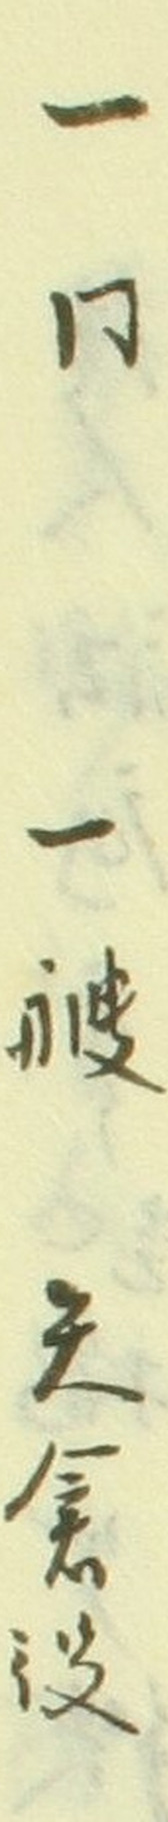一同一艘矢倉役
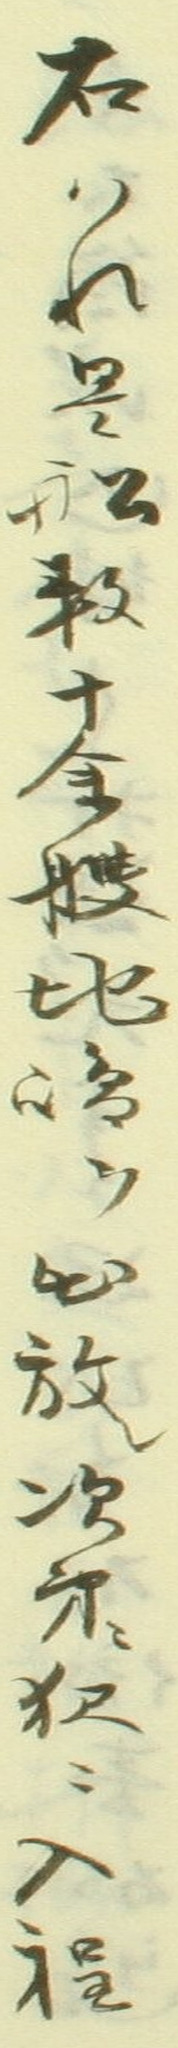右はれ日々船数十全艘地嶋江出放れ次第に夜に入程
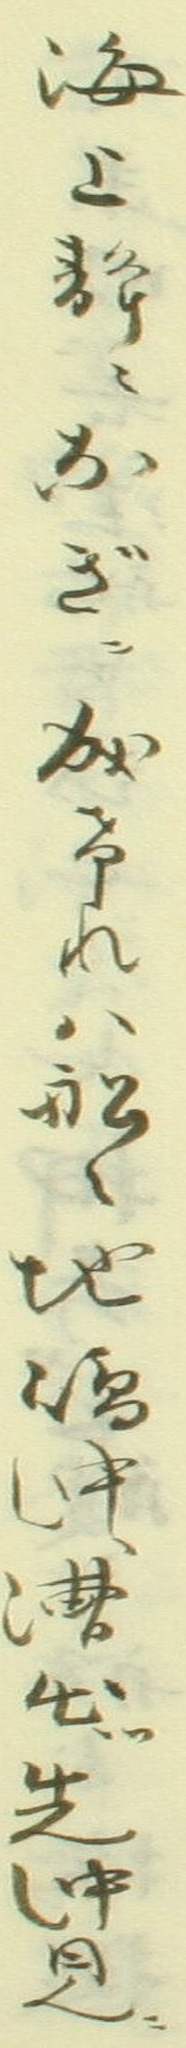海上静になぎに成けれは船船地嶋沖へ出候先沖見に
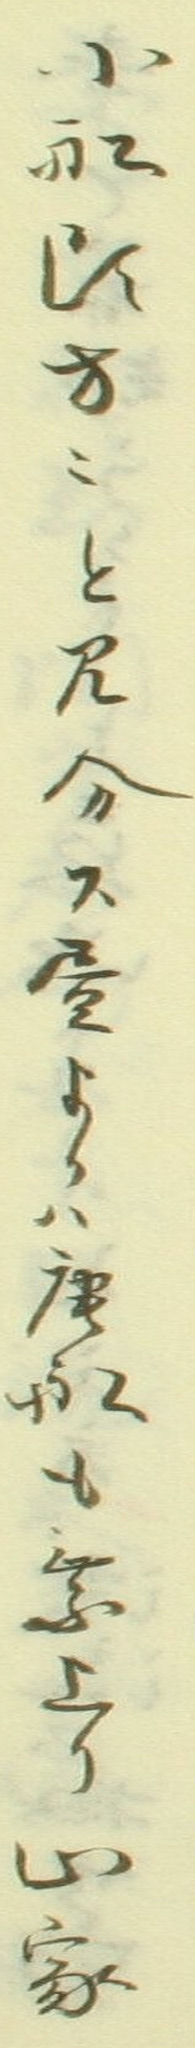小船頭方々と見分す昼よりは唐船も乗上り山家
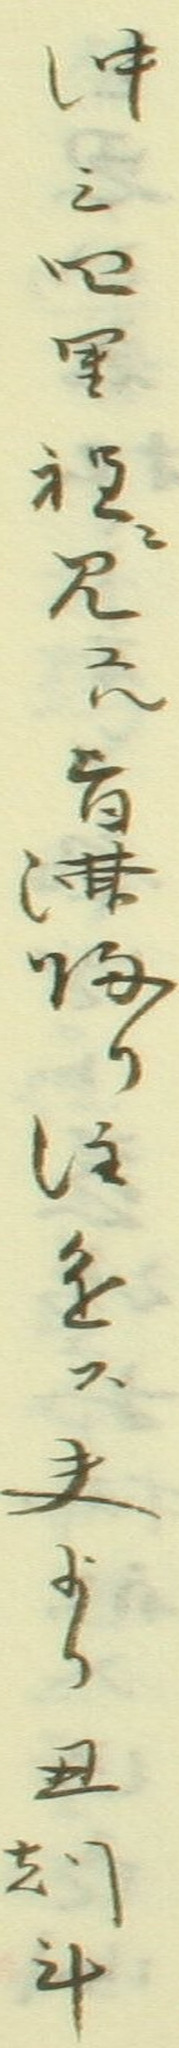沖三四里程に見ゆる旨漕帰り注進す夫より丑刻斗
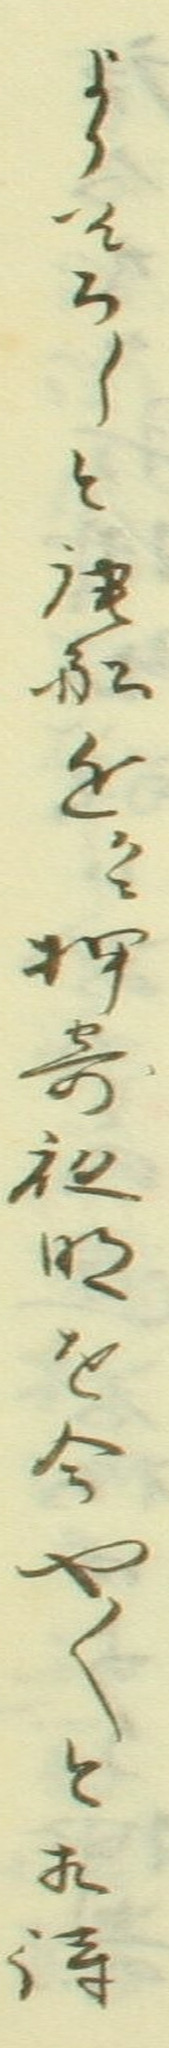よりそろそろと唐船近くに押寄夜明を今や今やと相待
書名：唐船漂流記 三
